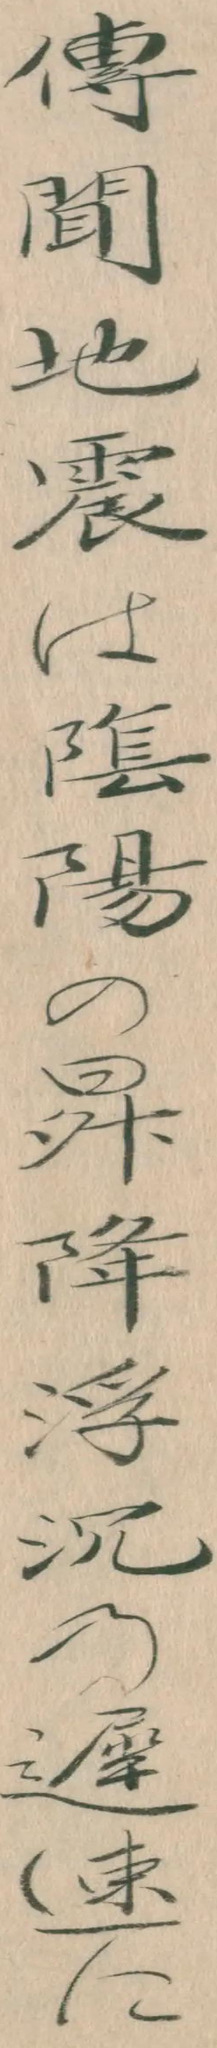伝聞地震は陰陽の昇降浮沈の遅速に
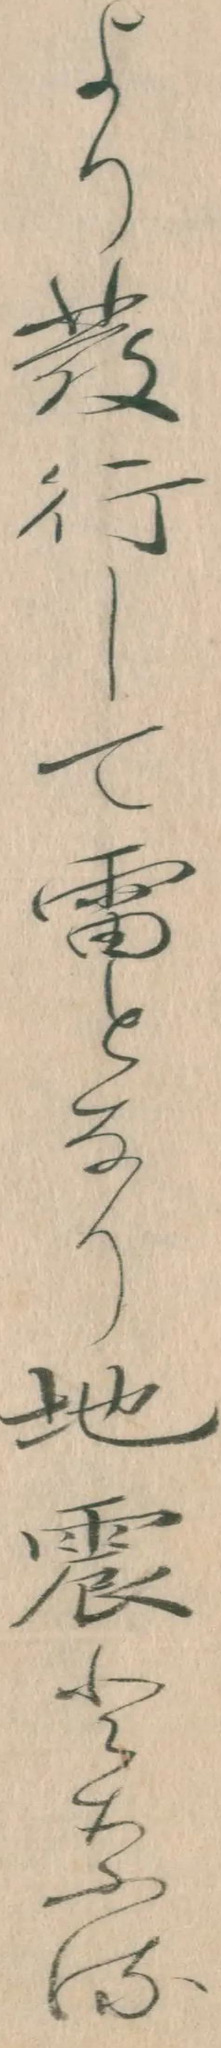より発行して雷となり地震となる
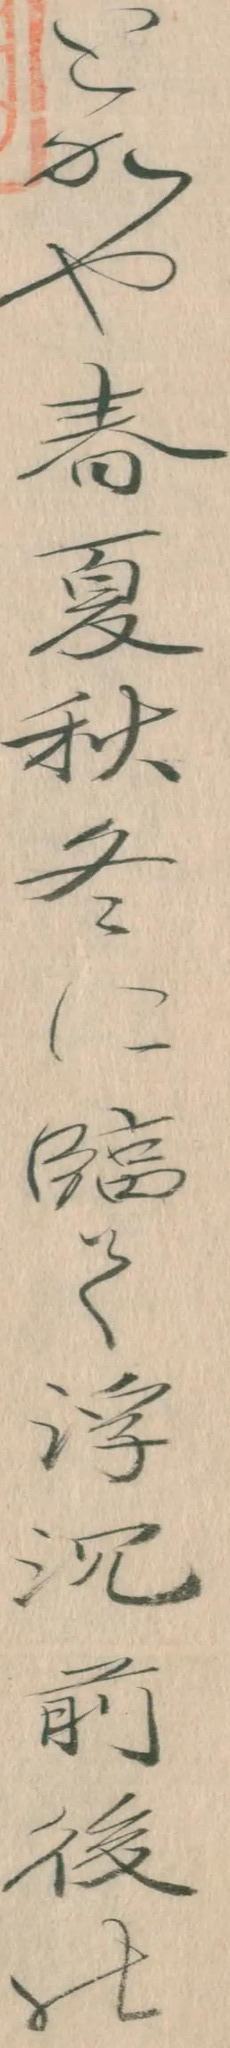とかや春夏秋冬に臨て浮沈前後の
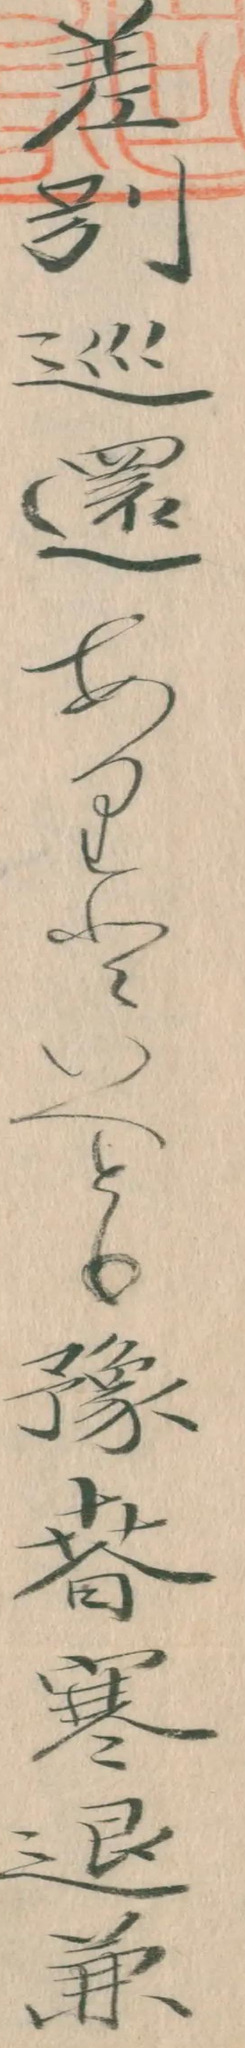差別巡還ありといへとも予春寒退兼
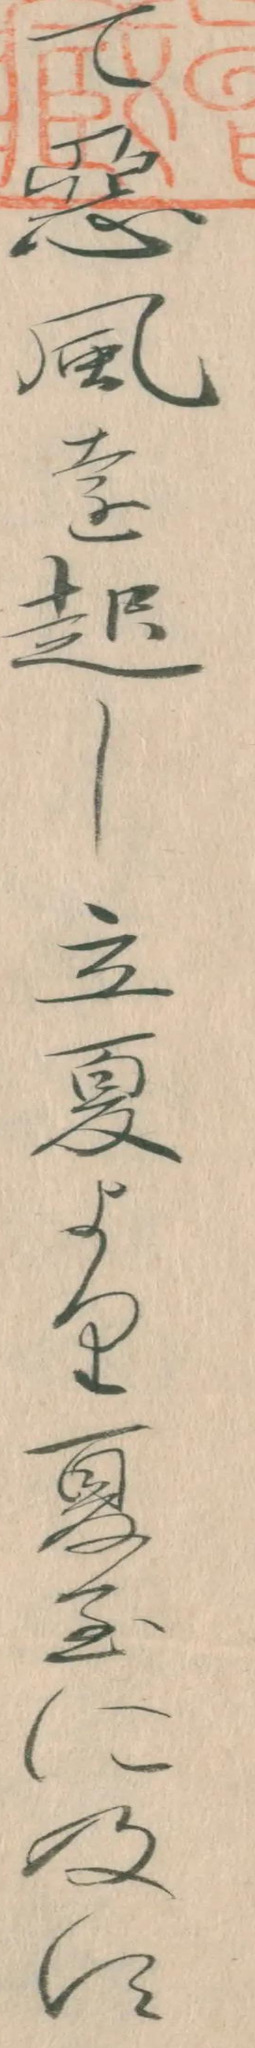て悪風を起し立夏より夏至に及す
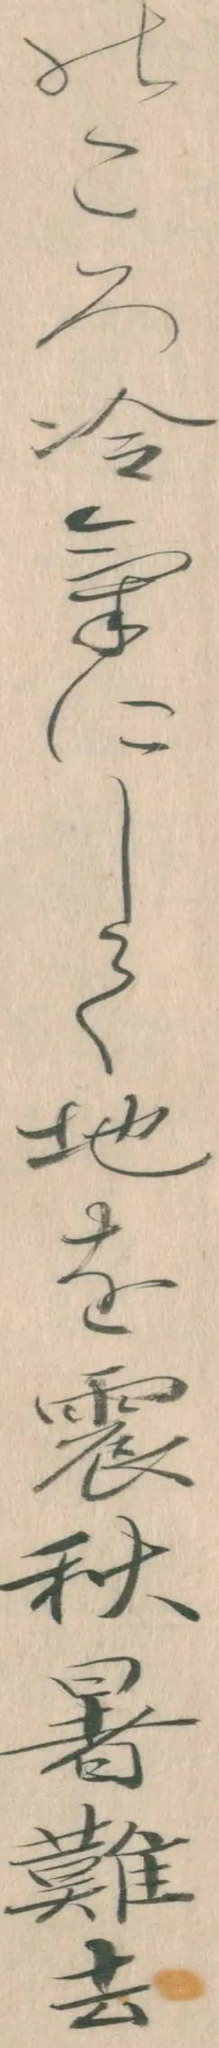のころ冷気にして地を震秋暑難去
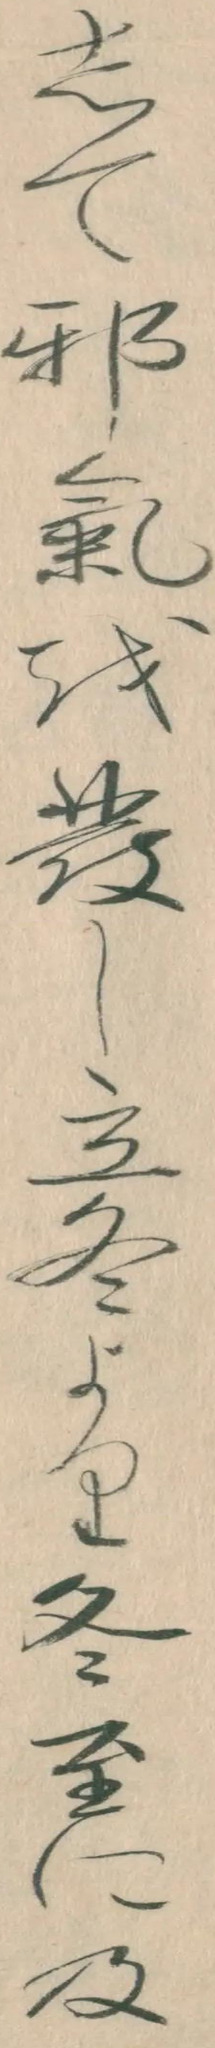して邪気を発し立冬より冬至に及

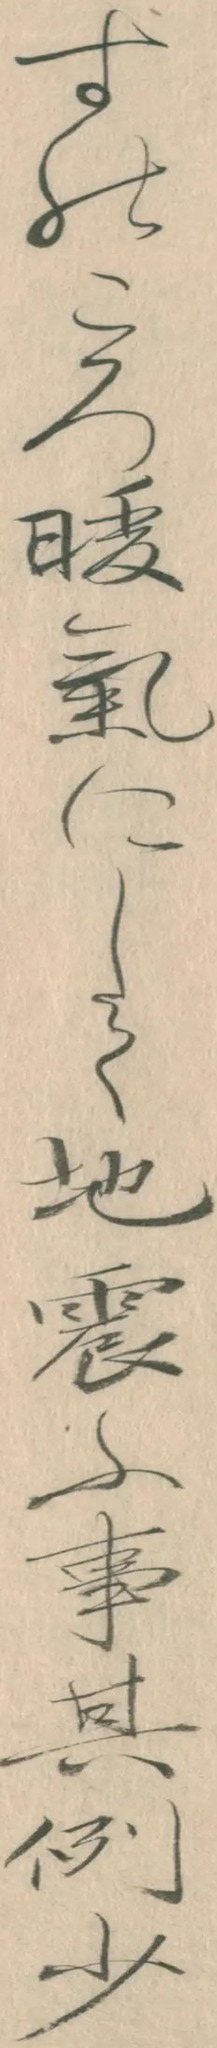すのころ暖気にして地震ふ事其例少
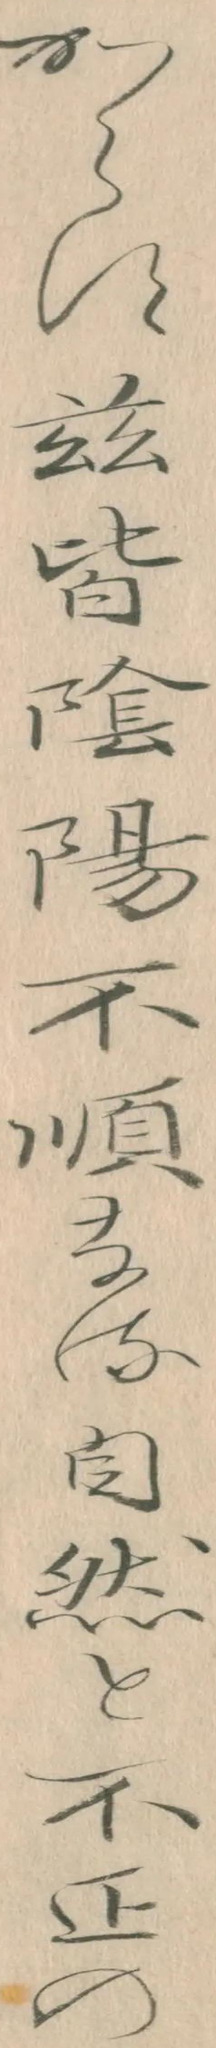からす茲皆陰陽不順なる自然と不正の
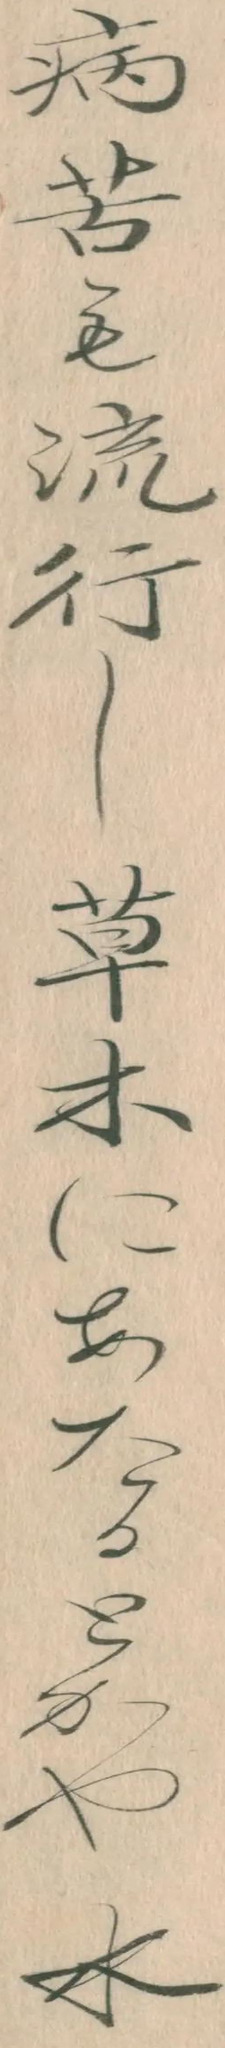病苦も流行し草木にあたるとかや水
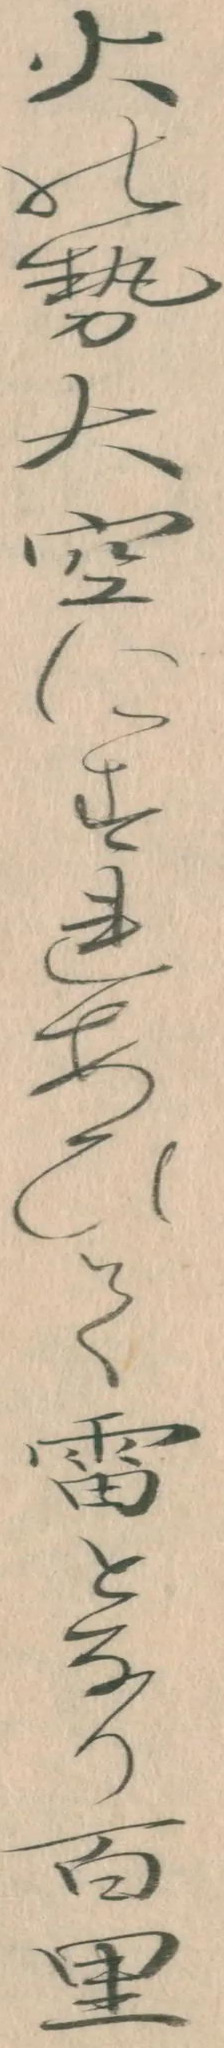火の勢大空にすれあひて雷となり百里
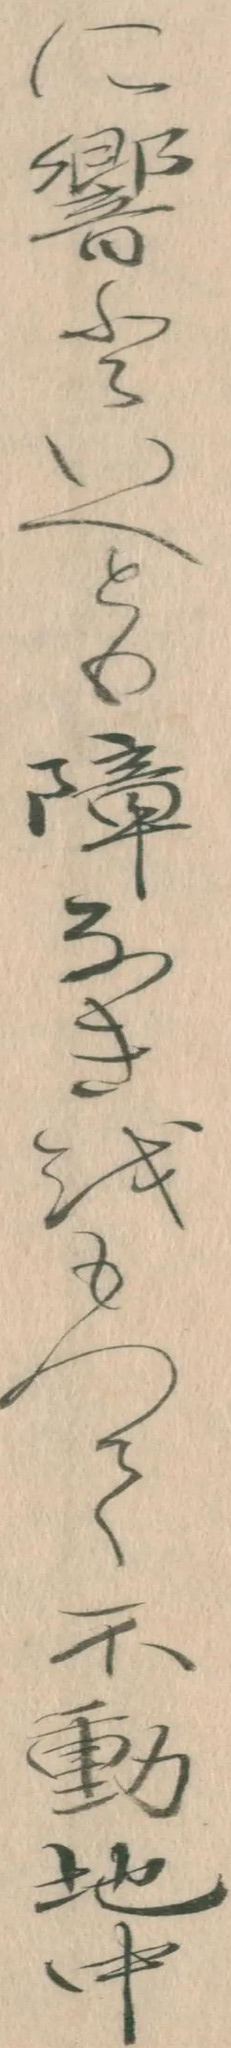に響といへとも障なきをもつて不動地中
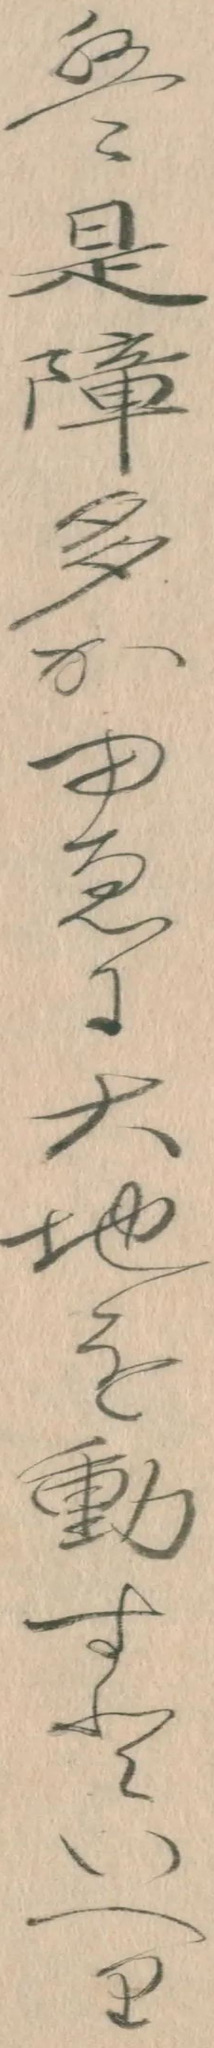は是障多かゆゑに大地を動すといへり
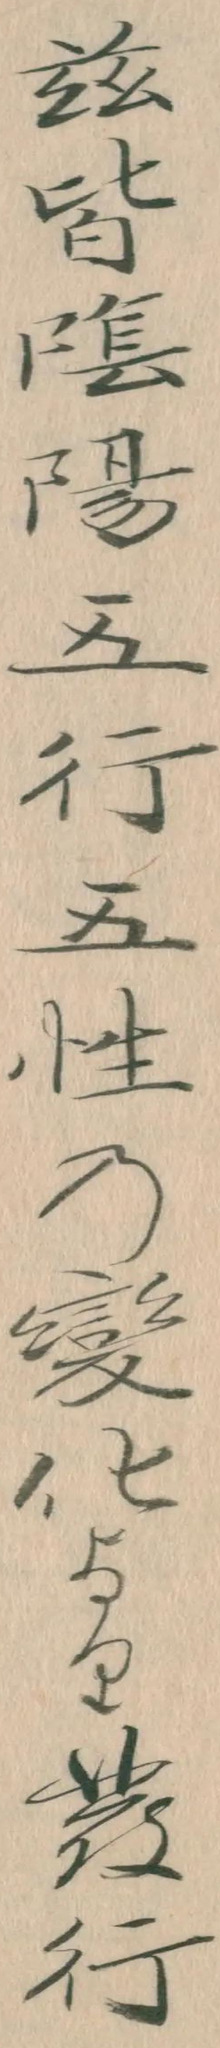茲皆陰陽五行五性の変化より発行
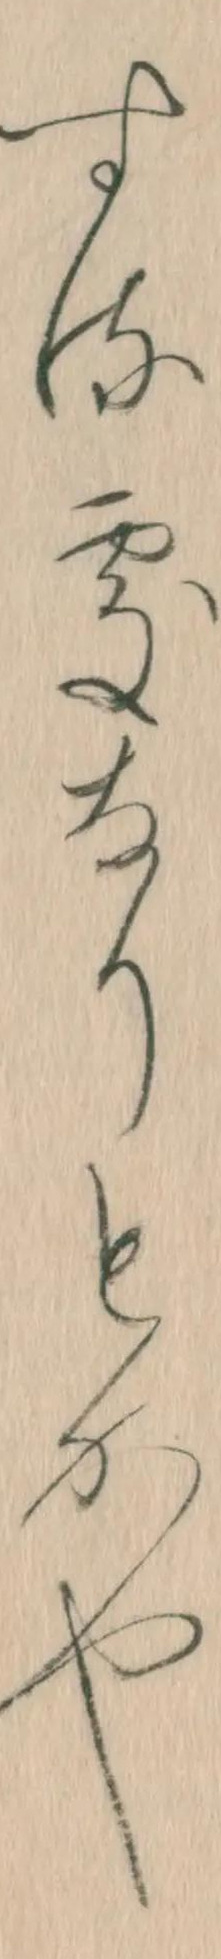する処なりとかや
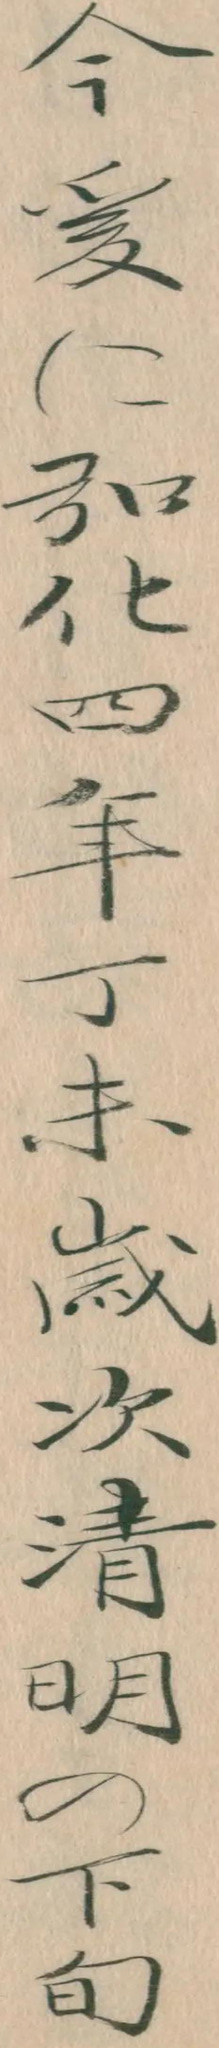今爰に弘化四年丁未歳次清明の下旬
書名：俗語之種. [1]
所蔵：国立国会図書館 National Diet Library, JAPAN
